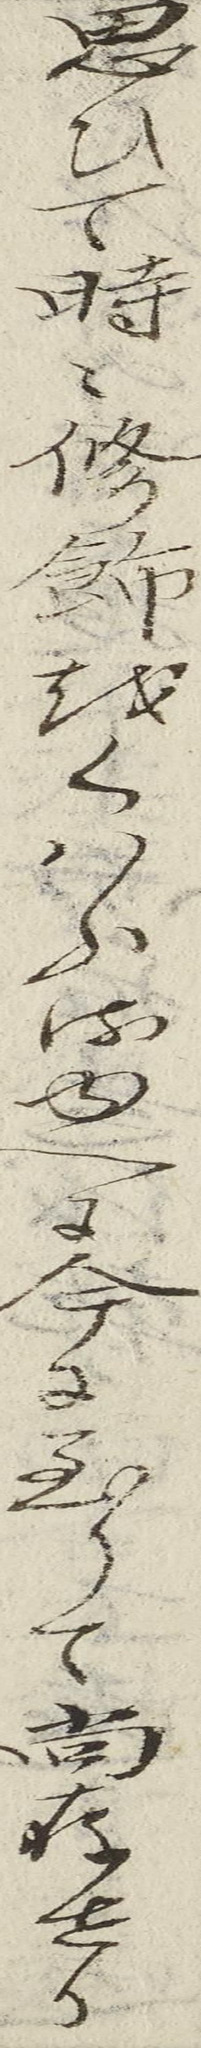思ひて時々修飾をくハふるゆへに今に至りて尚存せり
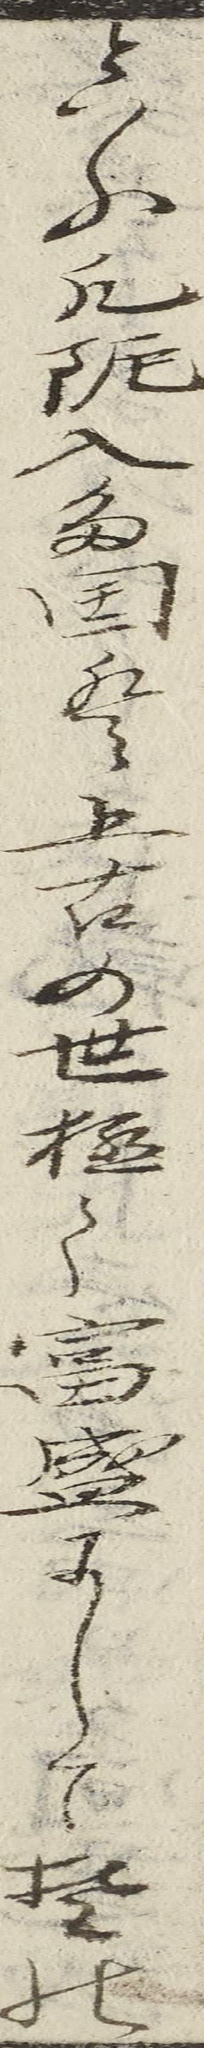といふ凡阨入多国は上古の世極て富盛にしてその
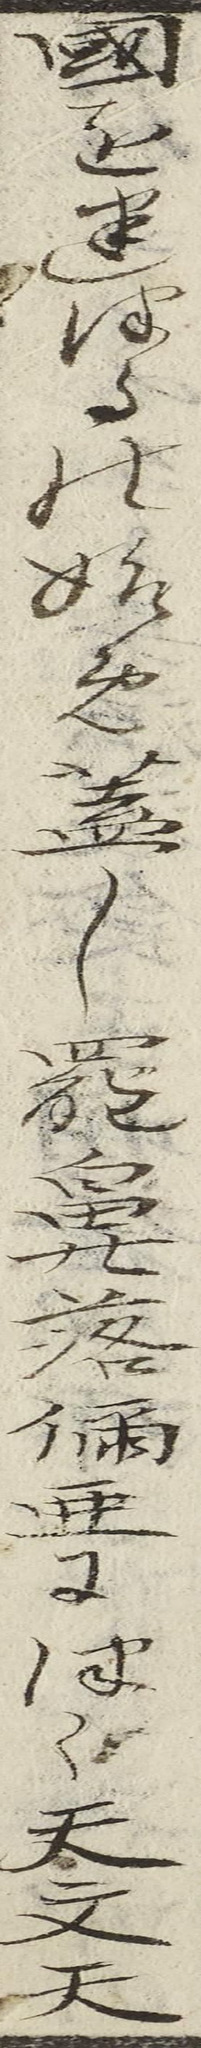国を建つるの始め蓋し羅鼻落儞亜につく天文天
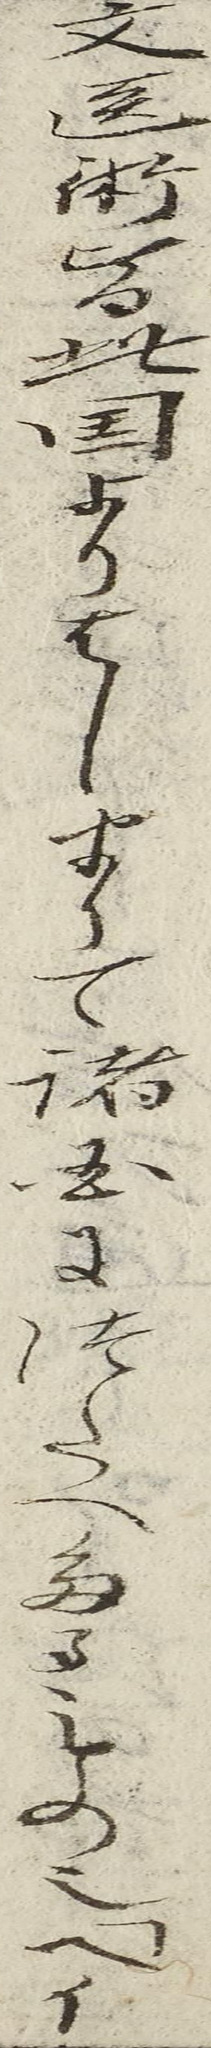文医術皆北国よりはしまりて諸国につたへたるもの也「ヘイ
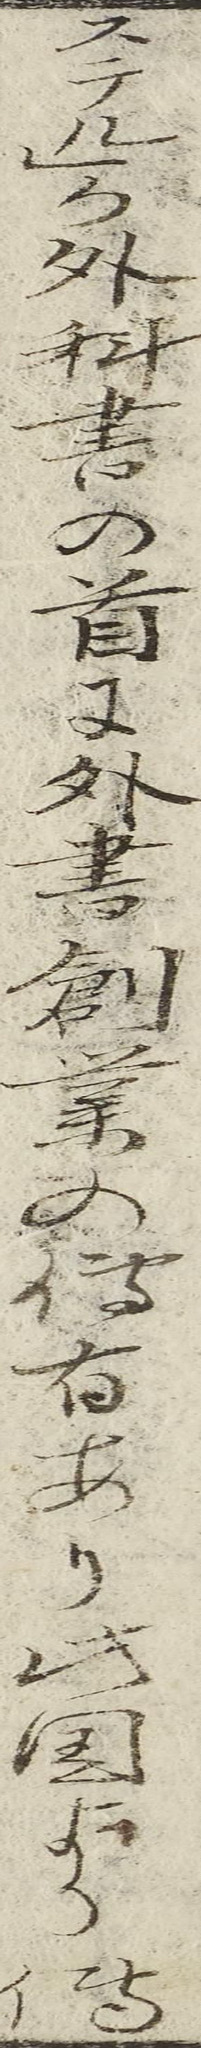ステル」の外科書の首に外書創業の伝有あり此国より伝
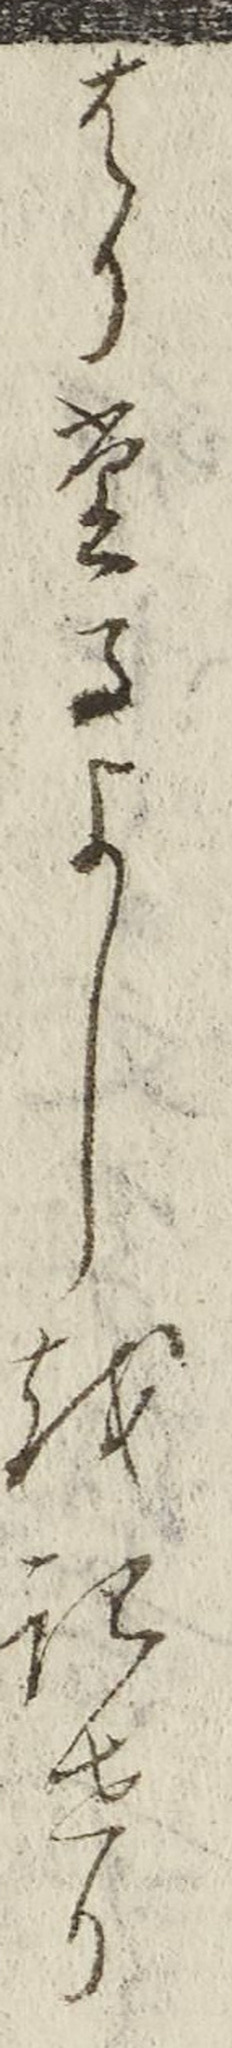はりたるよしを記せり

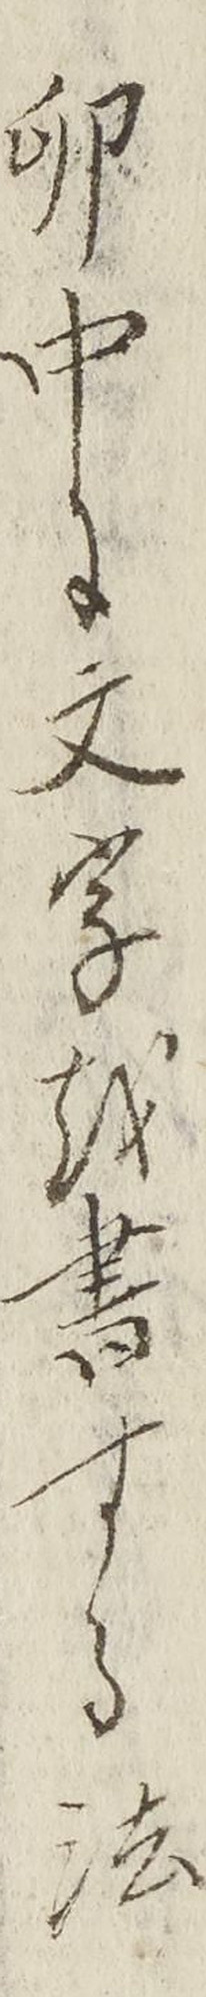卵中に文字を書する法
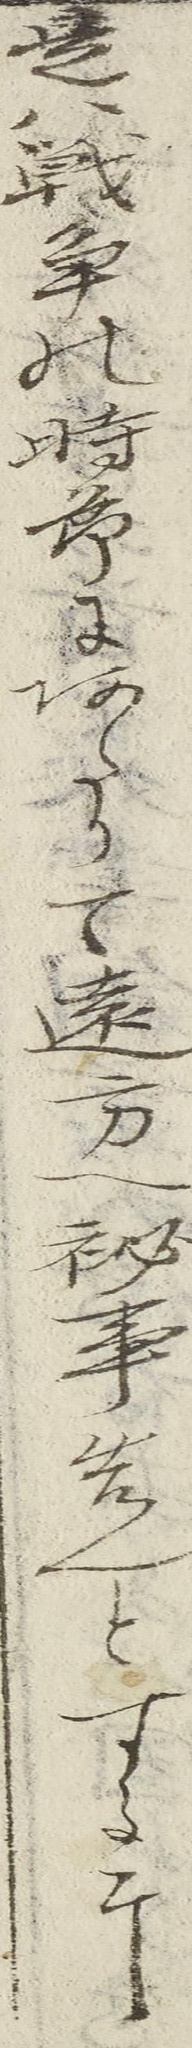是ハ戦争中の時節にありて遠方へ秘事告んとするに
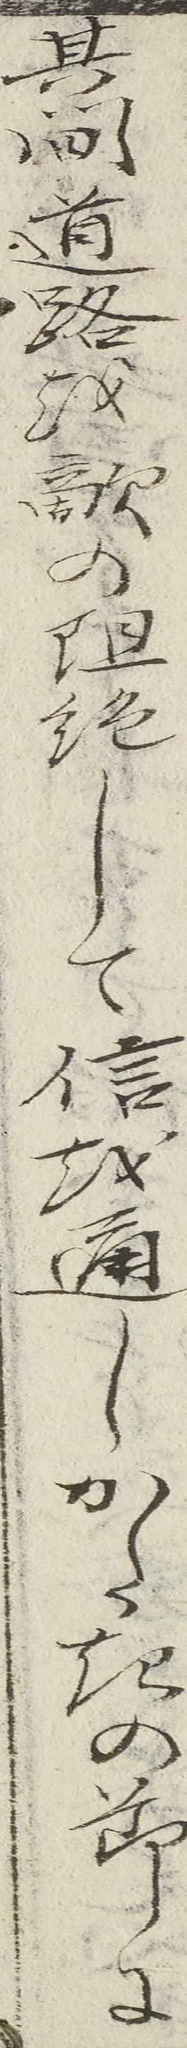其間道路を敵の阻絶して信を通しかたきの節に
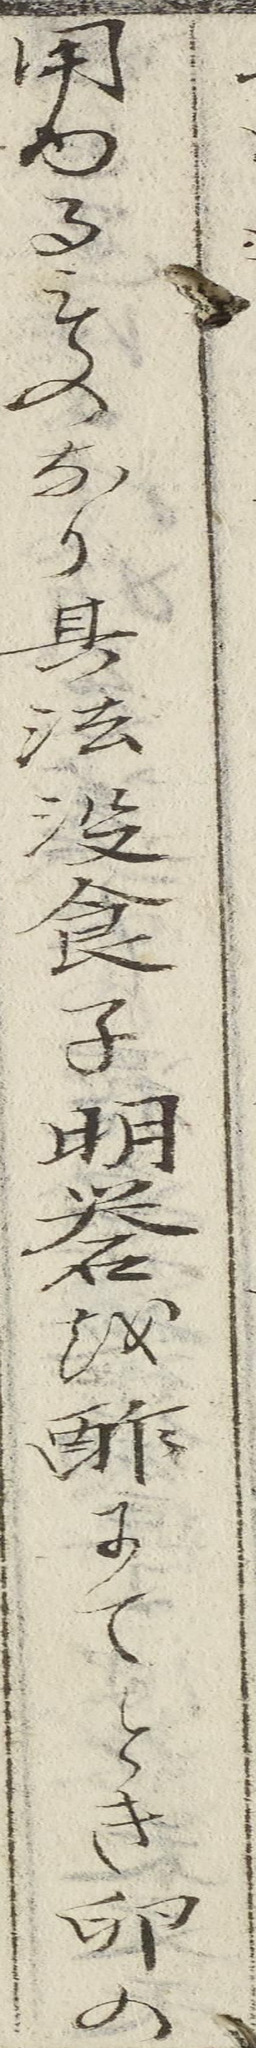用ゆるものなり其法没食子明礬を酢にてとき卵の
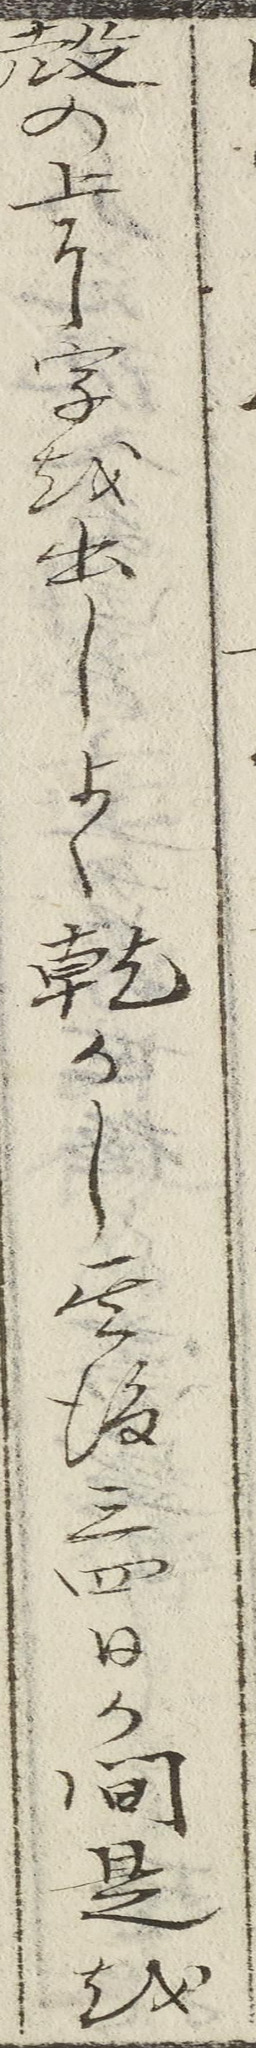殻の上に字を出しよく乾かし其後三四日か間是を
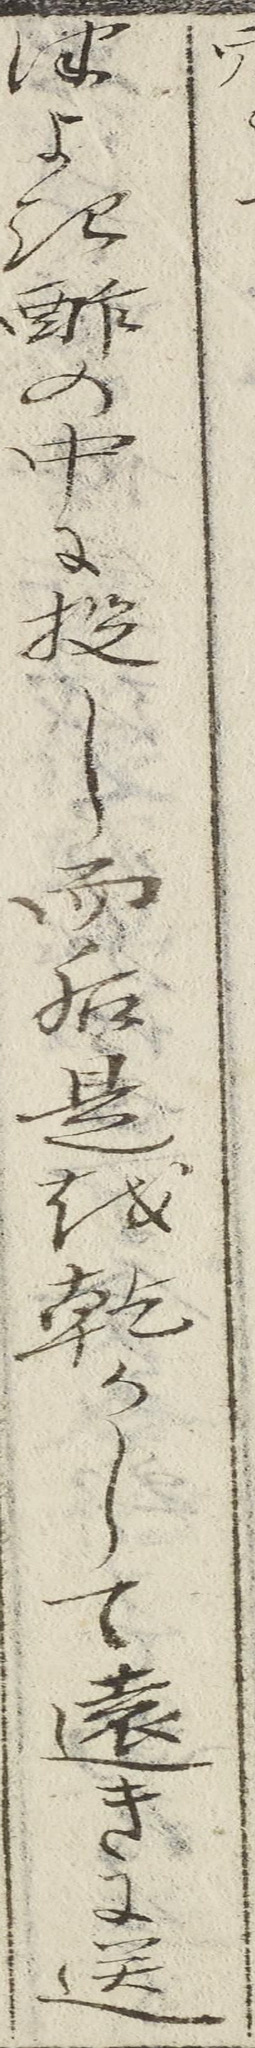つよき酢の中に投し而後是を乾かして遠きに送
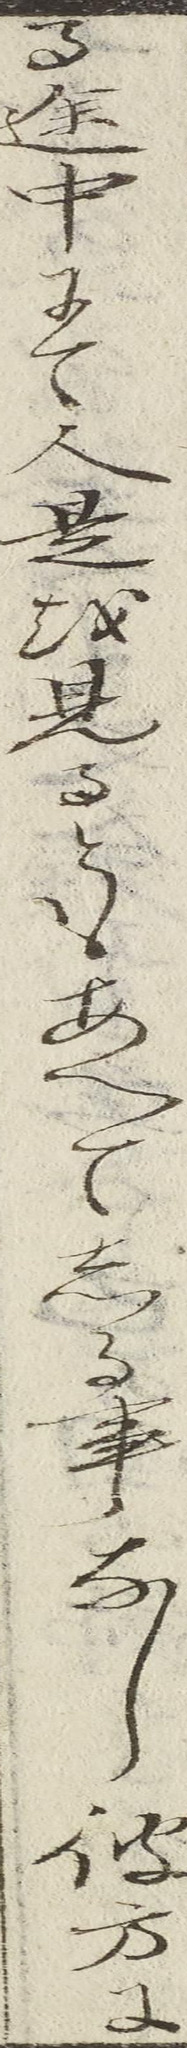る途中にて人是を見るともあへてしる事なし彼方に
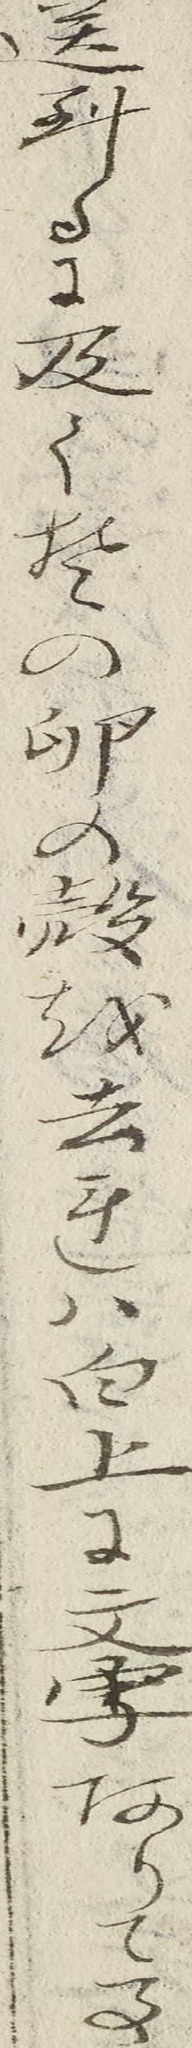送けるに及てその卵の殻を去れハ白上に文字ありて事
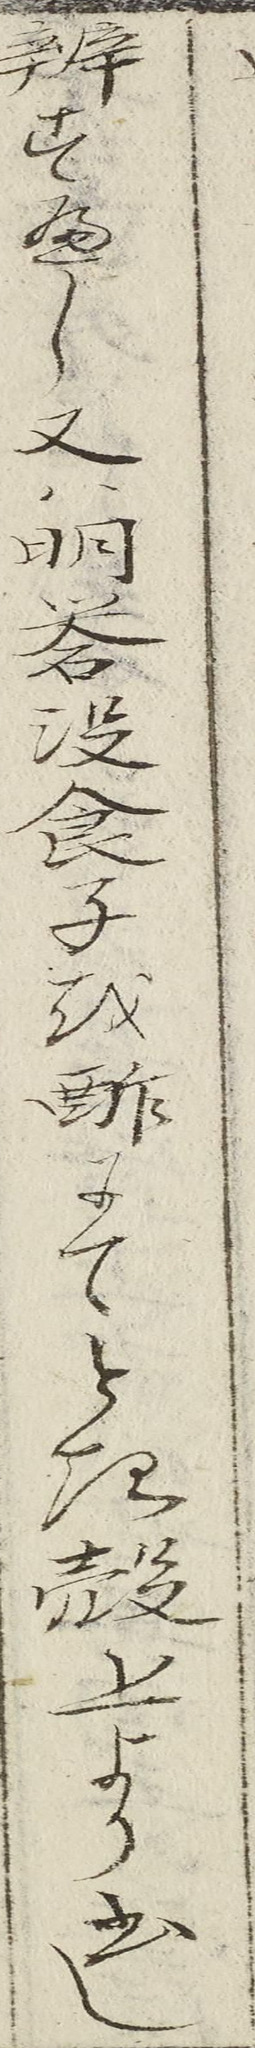辨すへし又ハ明礬没食子を酢にてとき殻上より出し
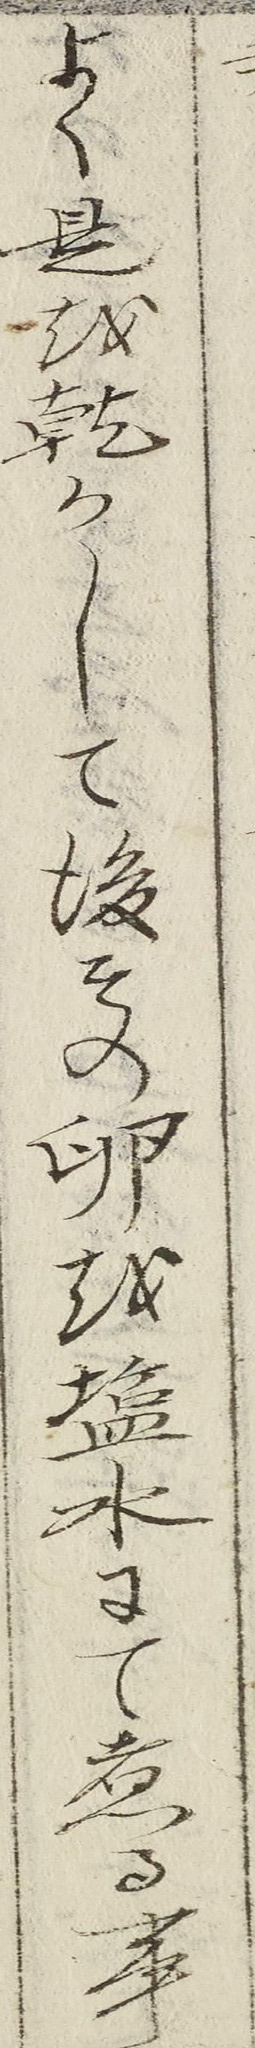よく是を乾かして後その卵を塩水にて煮る事
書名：西洋雜記　坤
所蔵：東京大学地震研究所図書室 Earthquake Research Institute Library, The University of Tokyo, JAPAN
